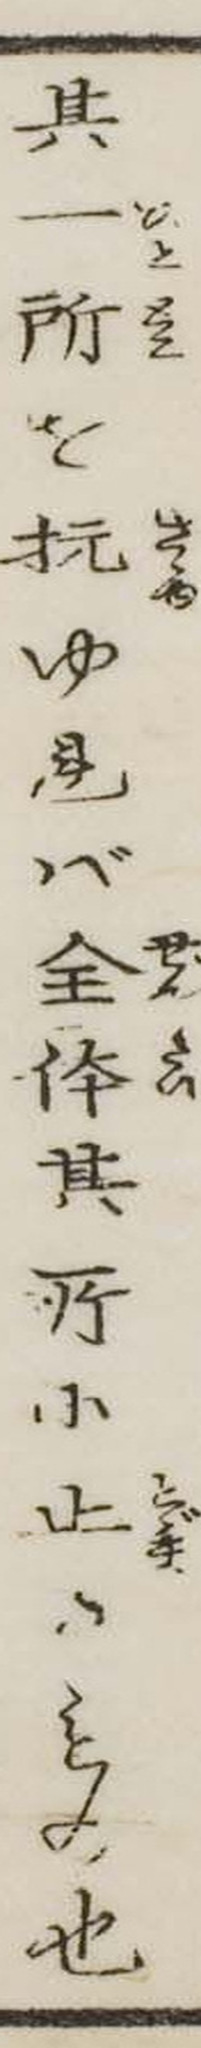其一所を抏ゆれば全体其所に止るもの也
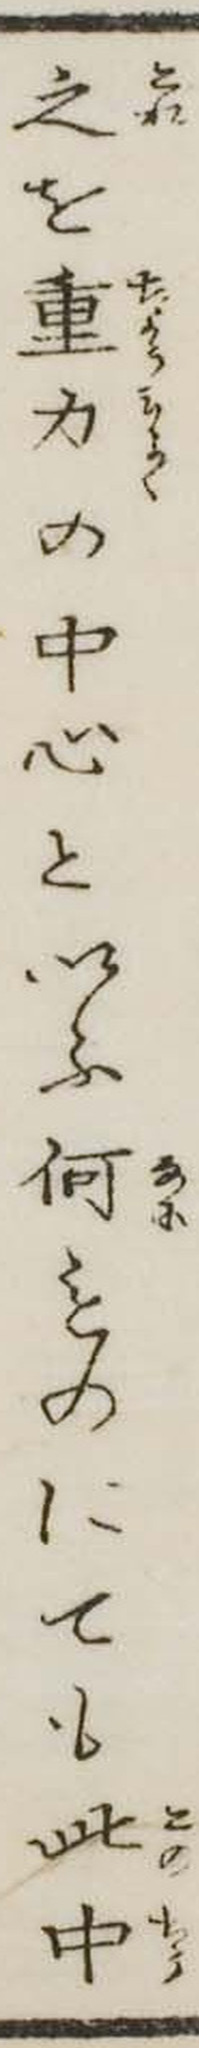之を重力の中心といふ何ものにても此中
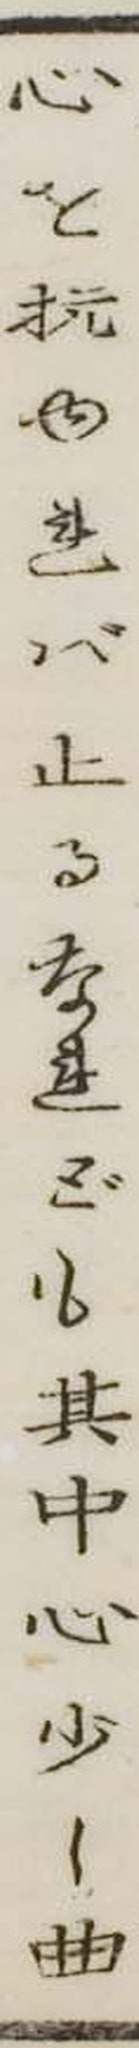心を抏ゆれば止るなれども其中心少し曲
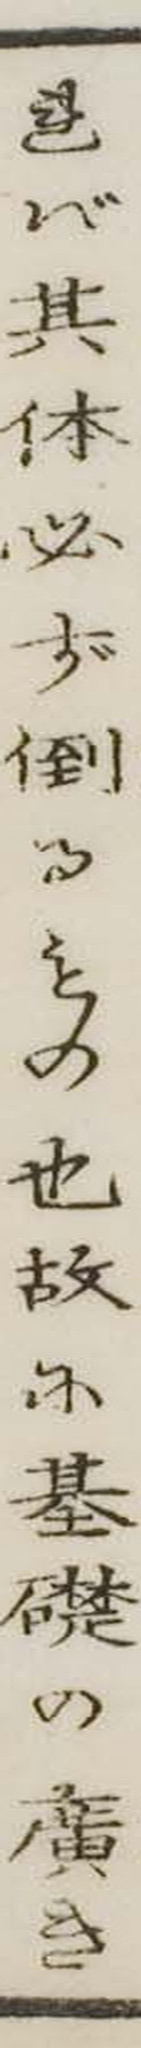れば其体必ず倒るもの也故に基礎の廣き
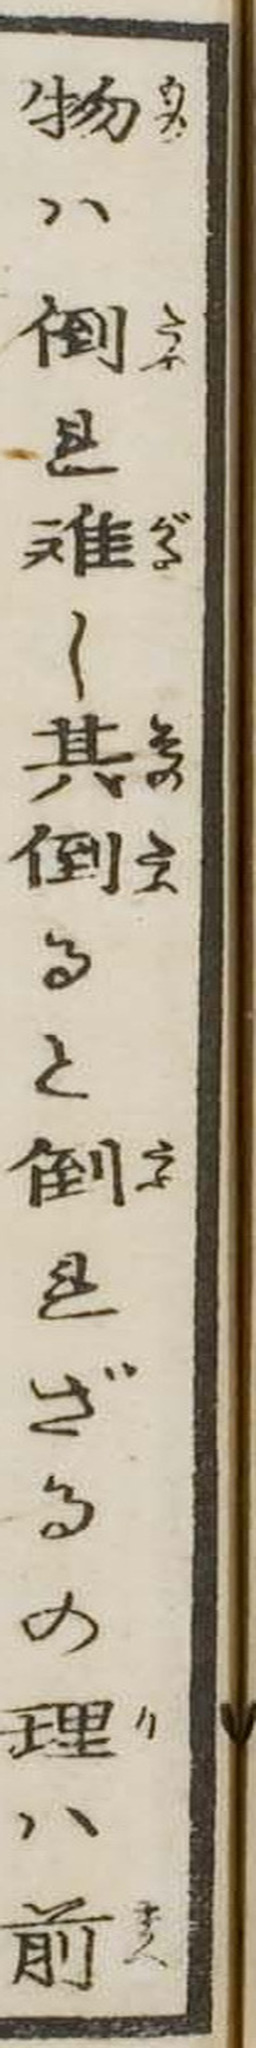物は倒れ難し其倒ると倒れざるの理は前
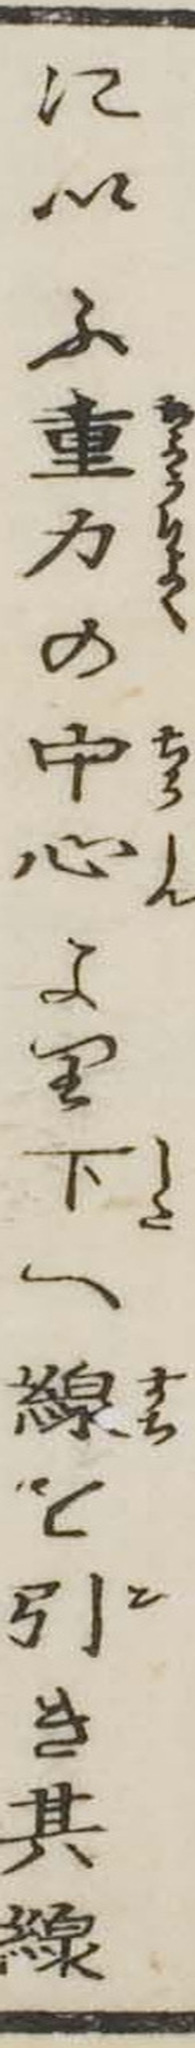にいふ重力の中心より下へ線を引き其線
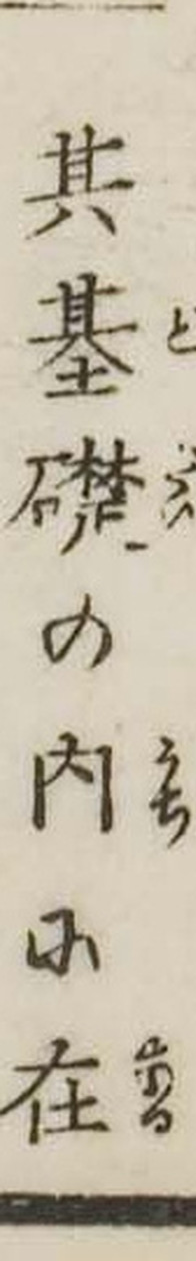其基礎の内に在
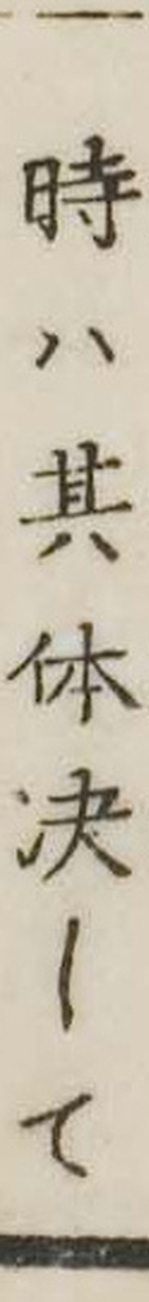時は其体決して
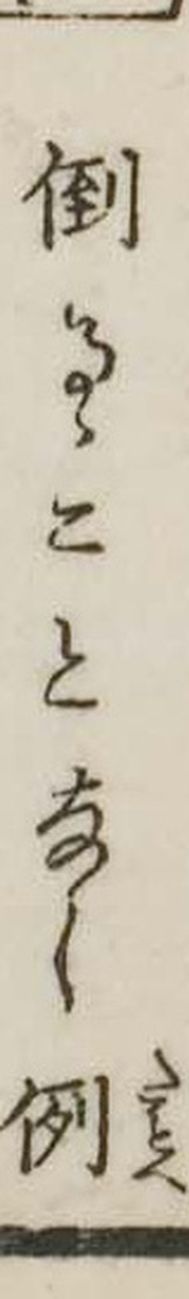倒るゝことなし例
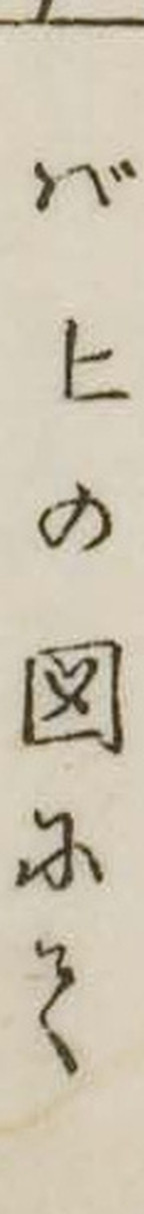ば上の図にて
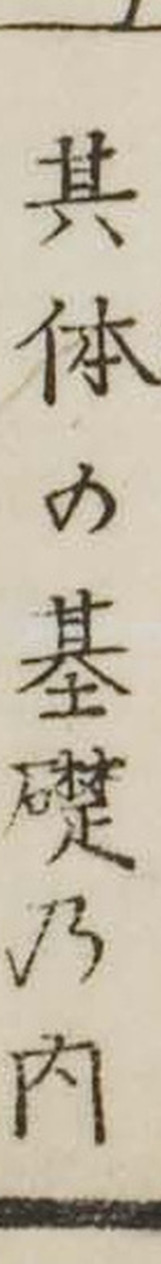其体の基礎の内

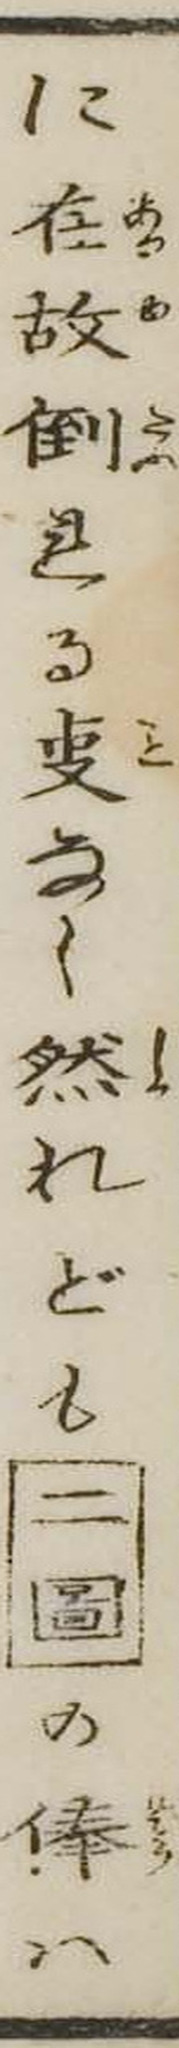に在故倒れる叓なし然れども[二圖]の俸は
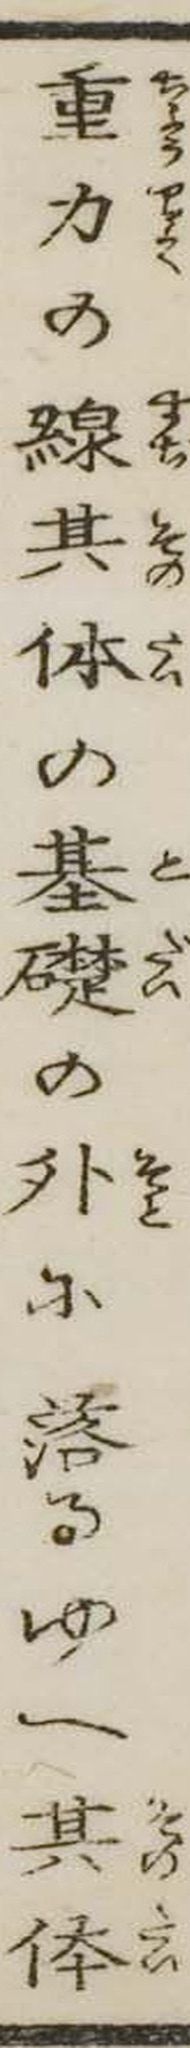重力の線其体の基礎の外に落るゆへ其体
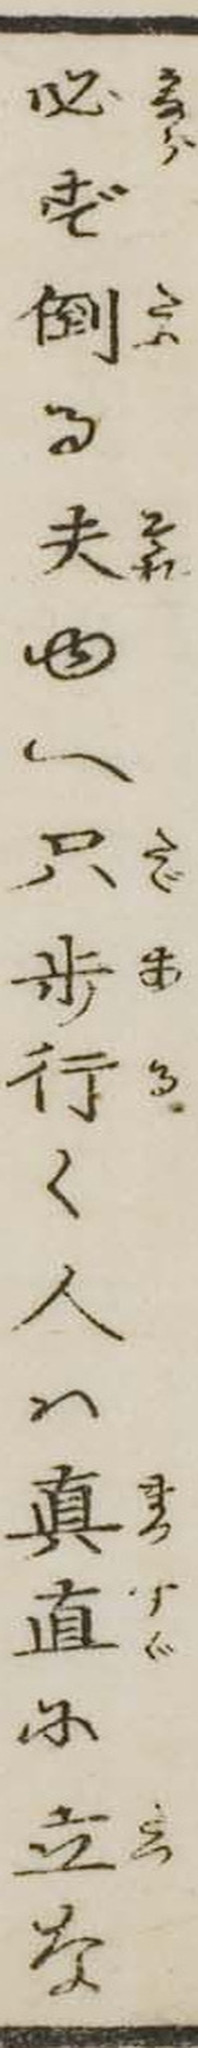必ず倒る夫ゆへ只歩行く人は真直に立な
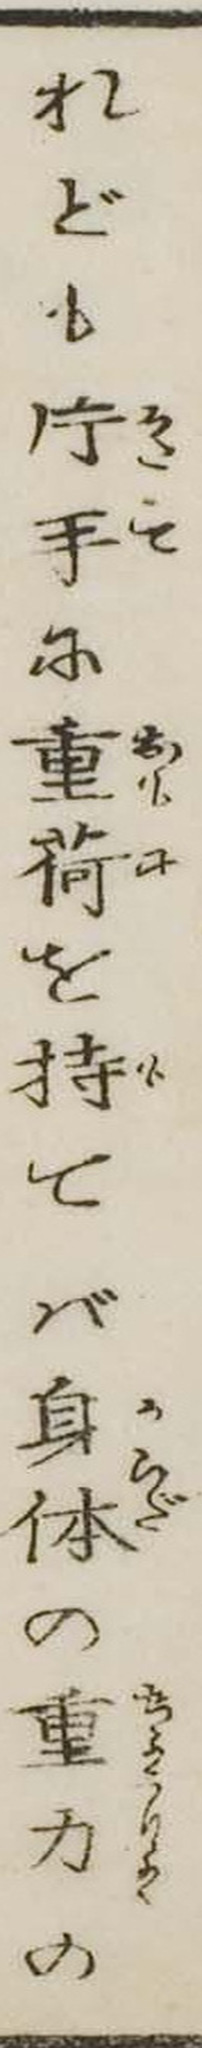れども片手に重荷を持てば身体の重力の
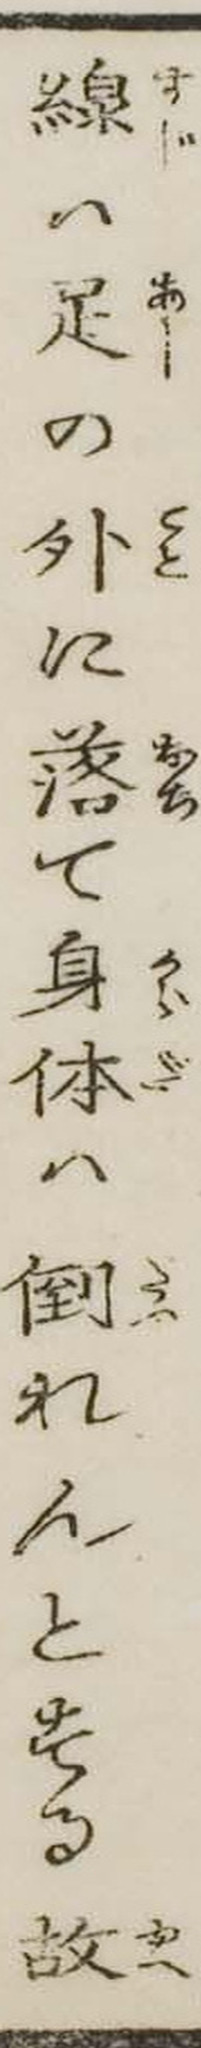線は足の外に落て身体は倒れんとする故
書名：究理知慧の勧 : 訓蒙画入 巻之2
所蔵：東京学芸大学附属図書館
